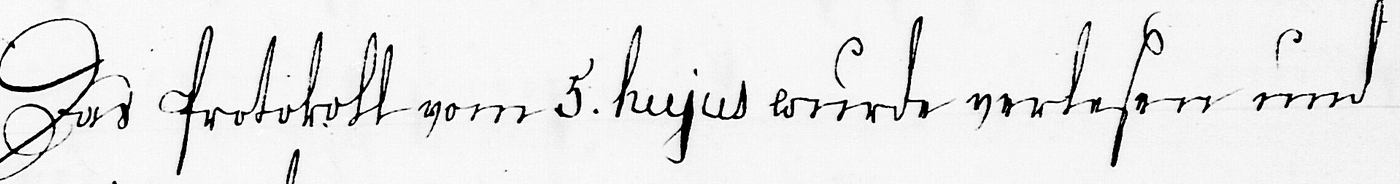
Das Protokoll vom 5. hujus wurde verlesen und
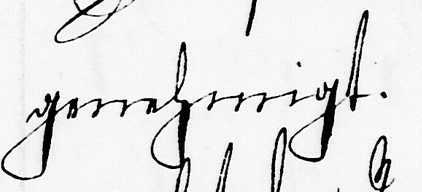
genehmigt.
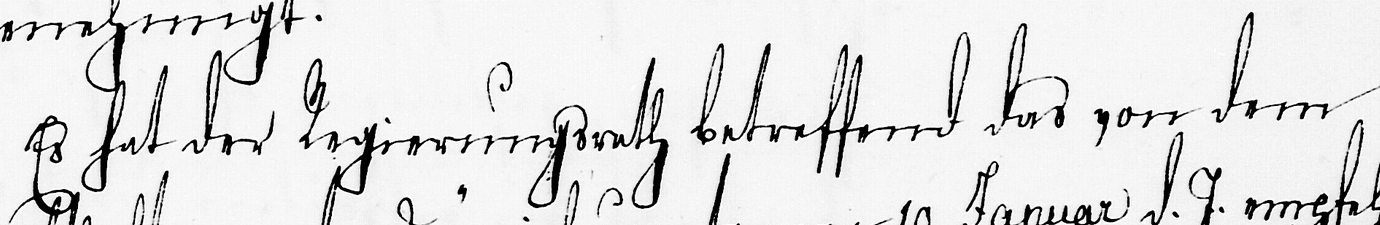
Es hat der Regierungsrath betreffend das von dem
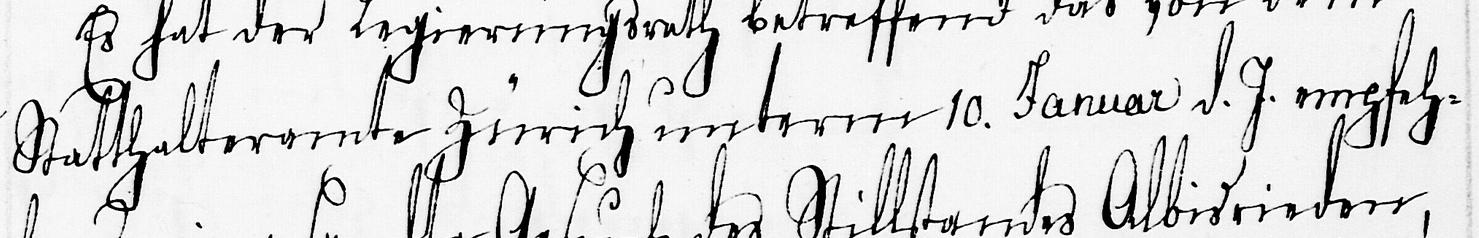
Statthalteramte Zürich unterm 10. Januar d. J. empfeh¬
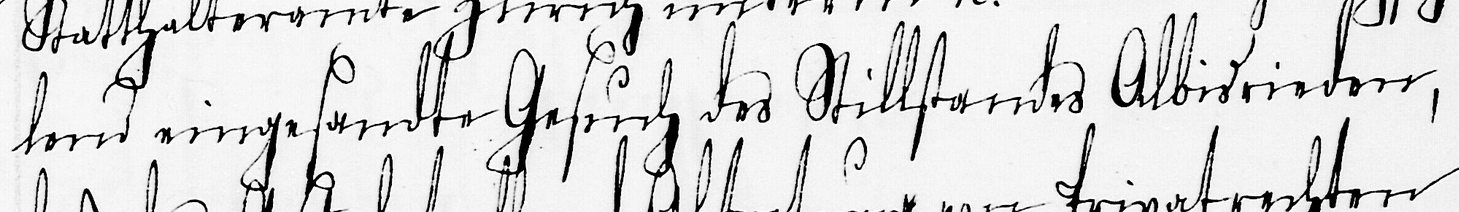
lend eingesandte Gesuch des Stillstandes Albisrieden,
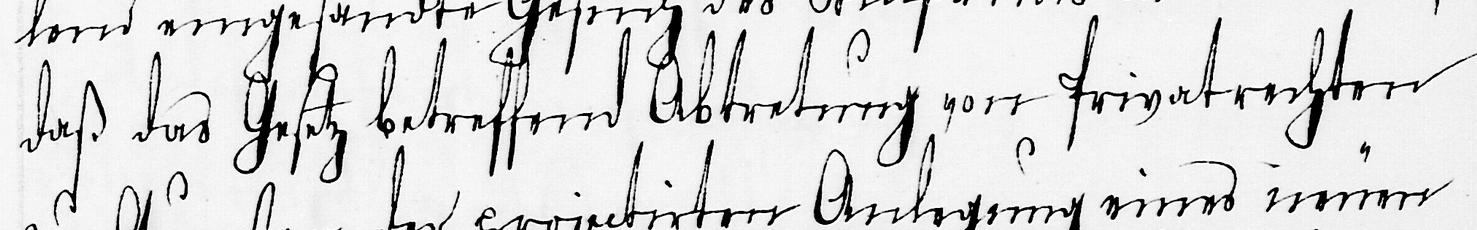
daß das Gesetz betreffend Abtretung von Privatrechten
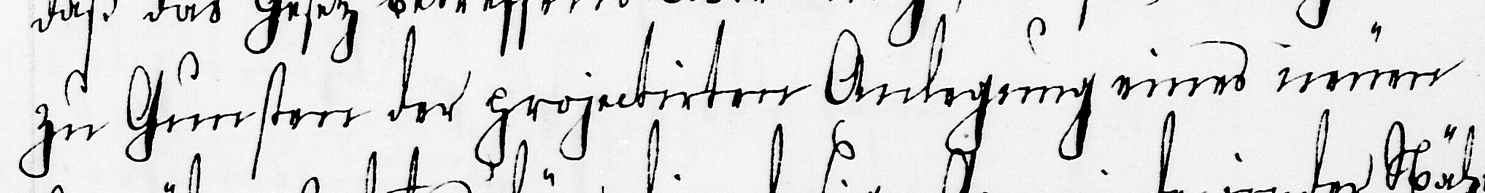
zu Gunsten der projectirten Anlegung eines neuen
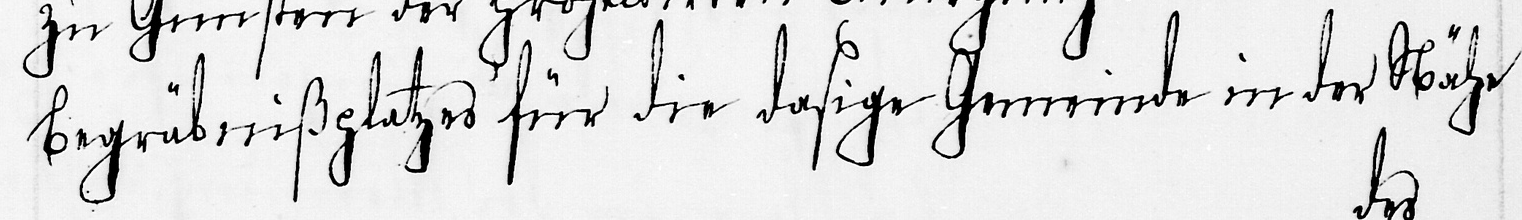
Begräbnißplatzes für die dasige Gemeinde in der Nähe
